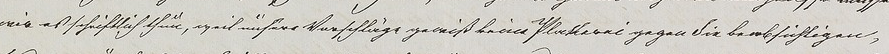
wir es schriftlich thun, weil unsere Vorschläge gewiß keine Plackerei gegen Sie beabsichtigen,
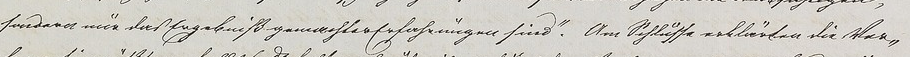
sondern nur das Ergebniß gemachter Erfahrungen sind». Am Schlusse erklärten die Ver-
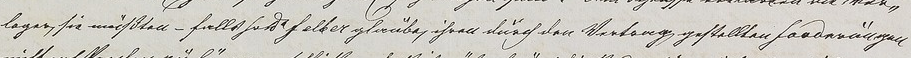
leger, sie müßten – falls Hr DrFelber glaube, ihren durch den Vertrag gestellten Forderungen
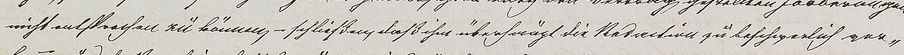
nicht entsprechen zu können, – schließen, daß ihm überhaupt die Redaction zu beschwerlich vor-
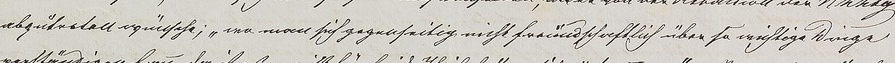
abzutreten wünsche; «wo man sich gegenseitig nicht freundschaftlich über so wichtige Dinge
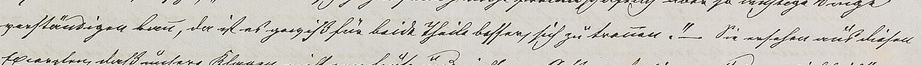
verständigen kann, da ist es gewiß für beide Theile besser, sich zu trennen.» – Sie ersehen aus diesen
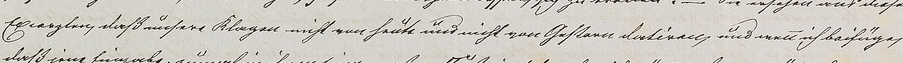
Excerpten, daß unsere Klagen nicht von heute und nicht von Gestern datiren, und wenn ich beifüge,
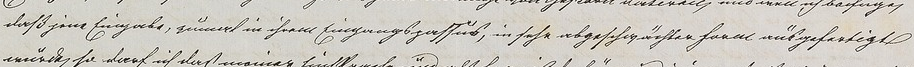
daß jene Eingabe, zumal in ihrem Eingangspassus, in sehr abgeschwächter Form ausgefertigt
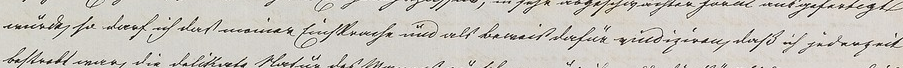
wurde, so darf ich das meiner Einsprache und als Beweis dafür eindiziren, daß ich jederzeit
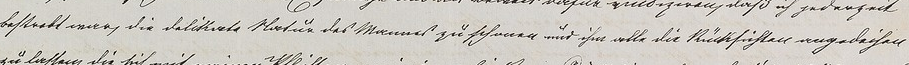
bestrebt war, die delikate Natur des Mannes zu schonen und ihm alle die Rücksichten angedeihen
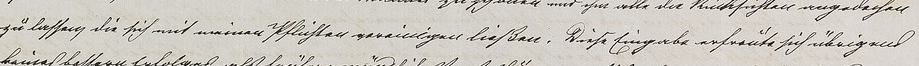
zu lassen, die sich mit meinen Pflichten vereinigen ließen. Diese Eingabe erfreute sich übrigens
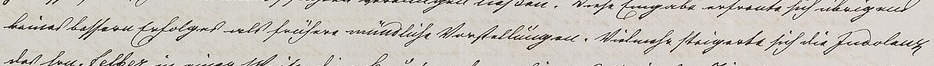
keines bessern Erfolges als frühere mündliche Vorstellungen. Vielmehr steigerte sich die Indolenz
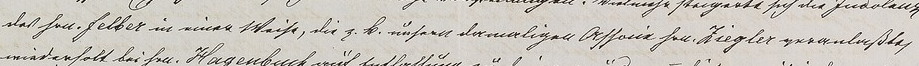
des Hrn. Felber in einer Weise, die z. B. unsern damaligen Associe Hrn. Ziegler veranlaßte,
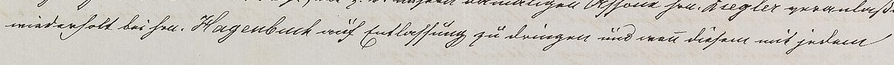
wiederholt bei Hrn. Hagenbuch auf Entlassung zu dringen und wenn diesem mit jedem
